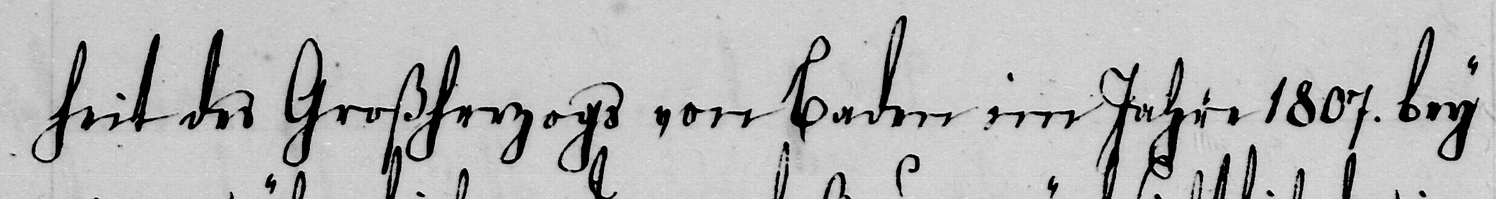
heit des Großherzogs von Baden im Jahre 1807. bey
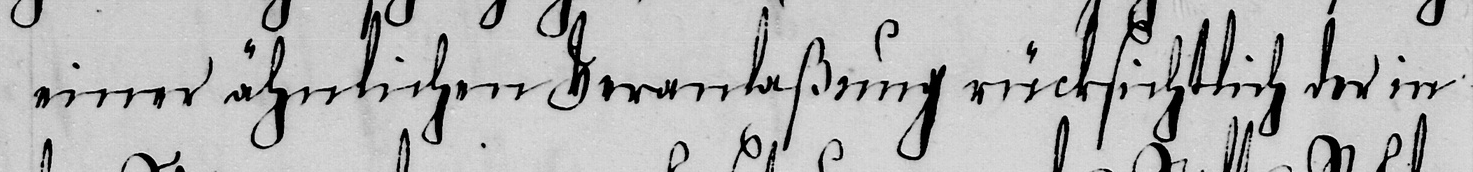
einer ähnlichen Veranlaßung rücksichtlich der in
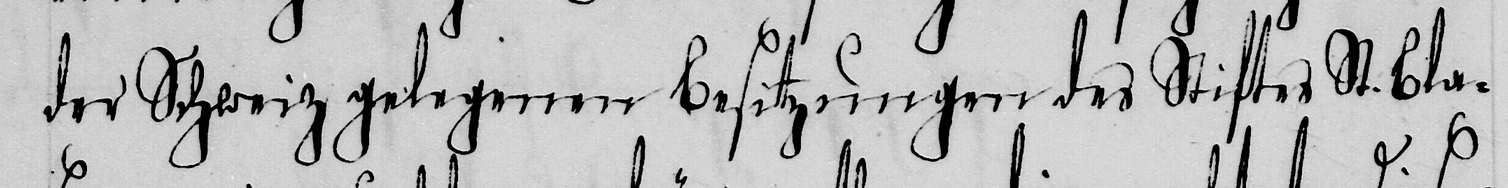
der Schweiz gelegenen Besitzungen des Stiftes St. Bla¬
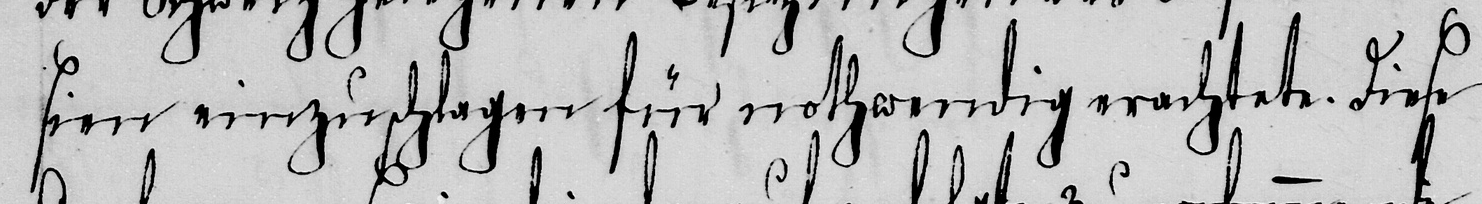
sien einzuschlagen für nothwendig erachtete. Diese
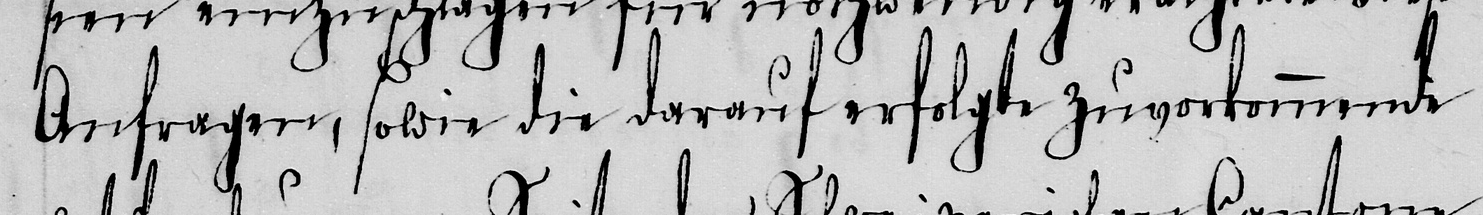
Anfragen, sowie die darauf erfolgte zuvorkommende
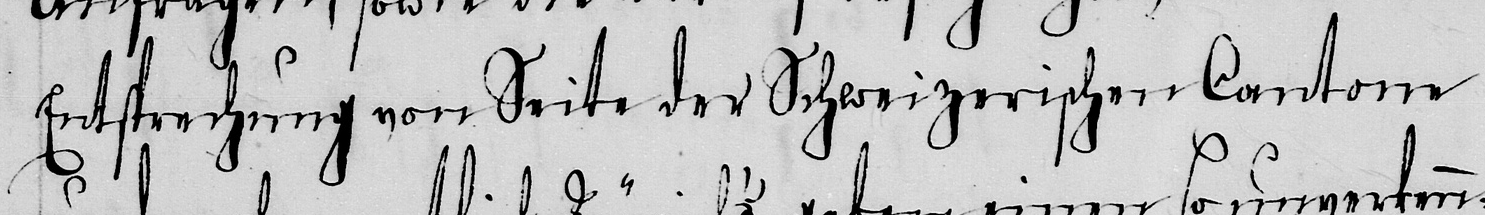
Entsprechung von Seite der Schweizerischen Cantone
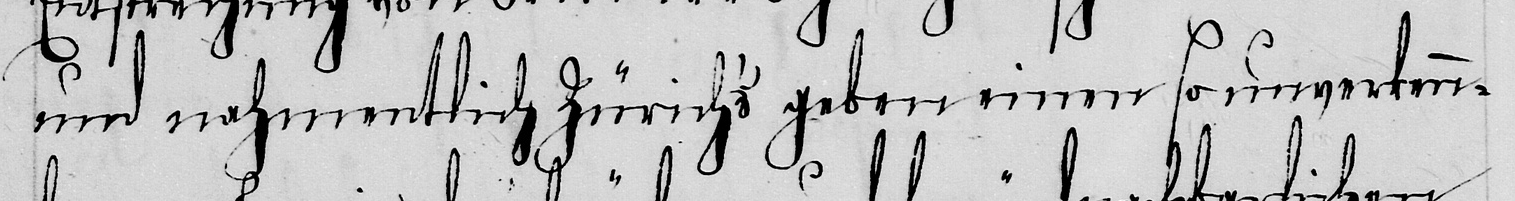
und nahmentlich Zürich’s geben einen so unverkenn¬
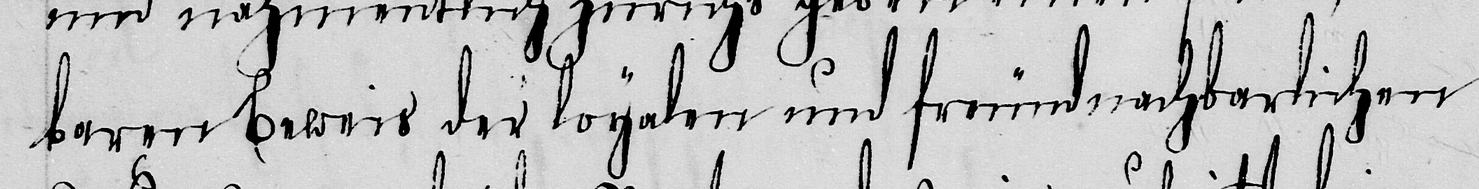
baren Beweis der loyalen und freundnachbarlichen
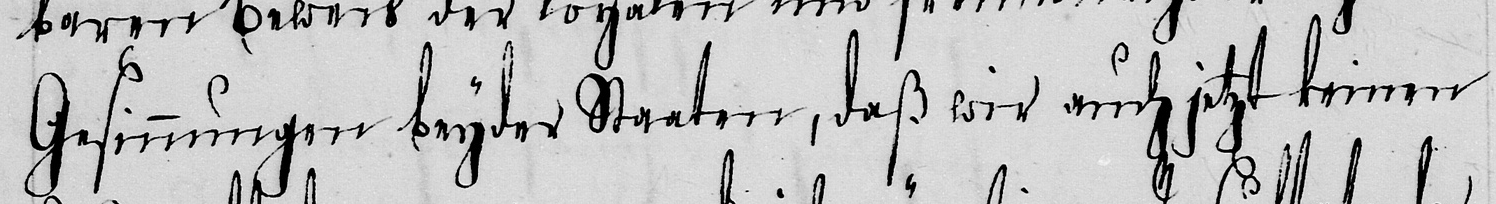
Gesinnungen beyder Staaten, daß wir auch jetzt keinen
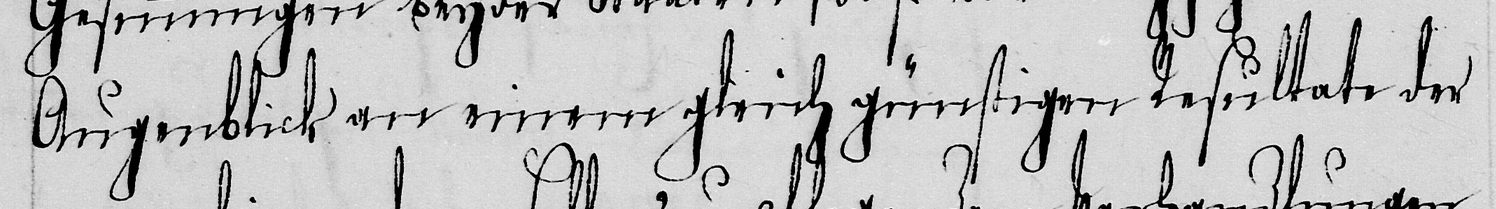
Augenblick an einem gleich günstigen Resultate der
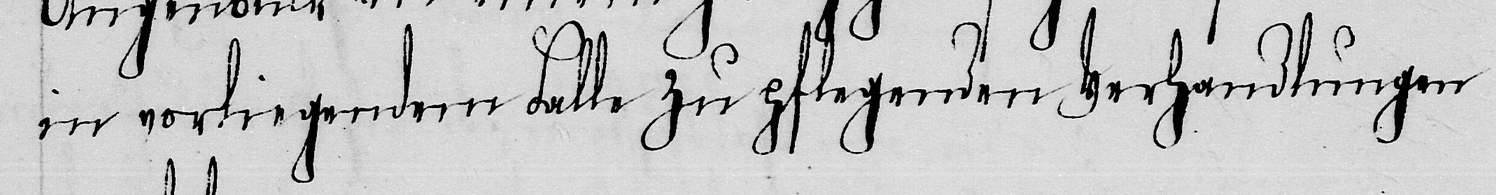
in vorliegendem Falle zu pflegenden Verhandlungen
